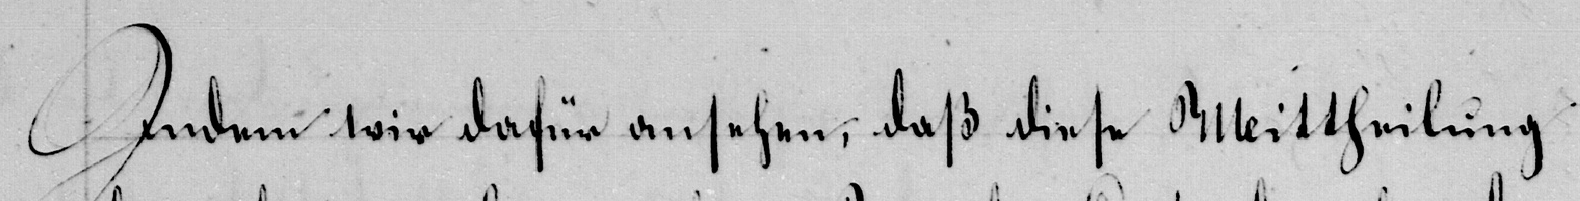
Indem wir dafür ansehen, daß diese Mittheilung
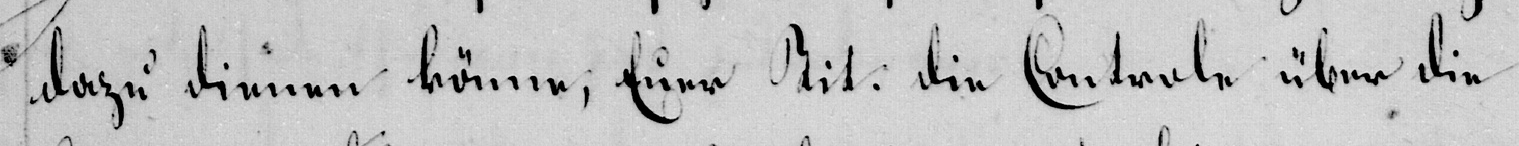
dazu dienen könne, Euer Tit. die Controle über die
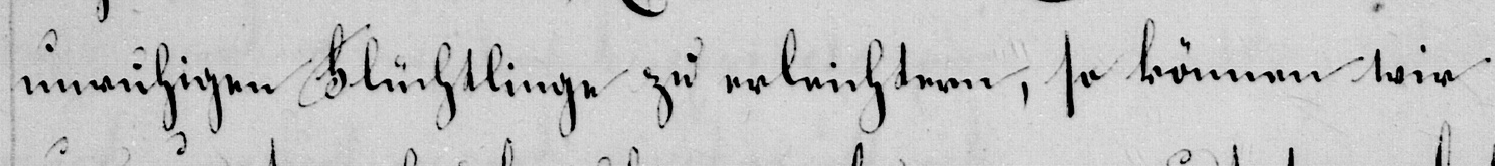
unruhigen Flüchtlinge zu erleichtern, so können wir
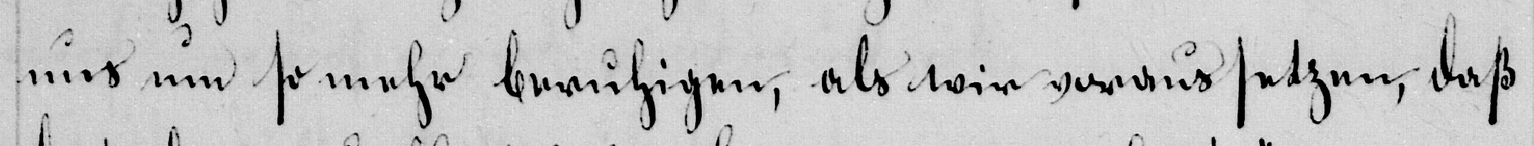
uns um so mehr beruhigen, als wir voraussetzen, daß
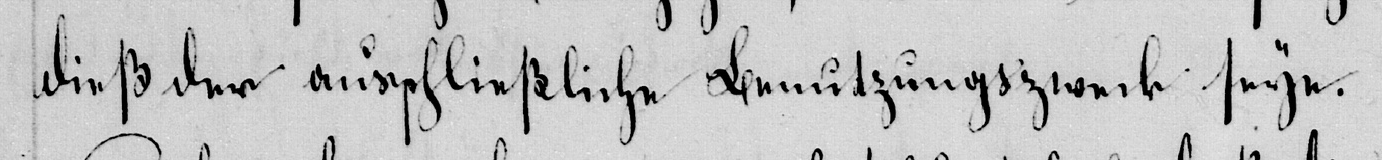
dieß der ausschließliche Benutzungszweck seye.
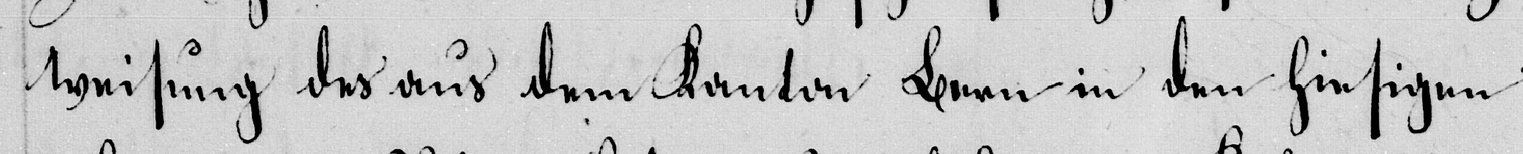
weisung des aus dem Kanton Bern in den hiesigen
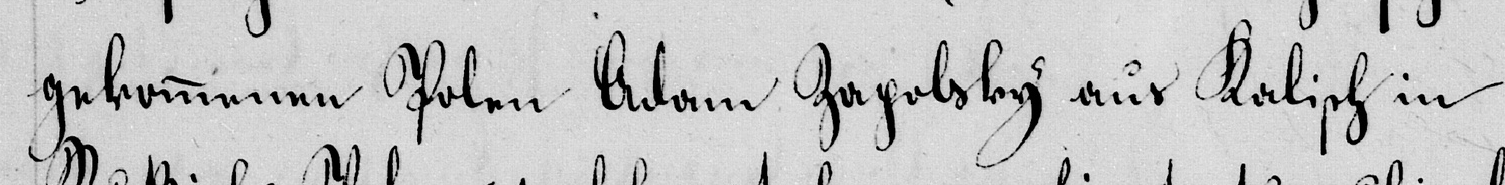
gekommenen Polen Adam Zapolsky aus Kalisch in
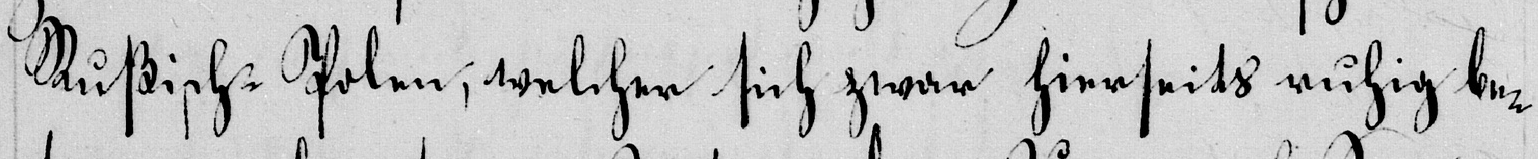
Rußisch-Polen, welcher sich zwar hierseits ruhig be¬
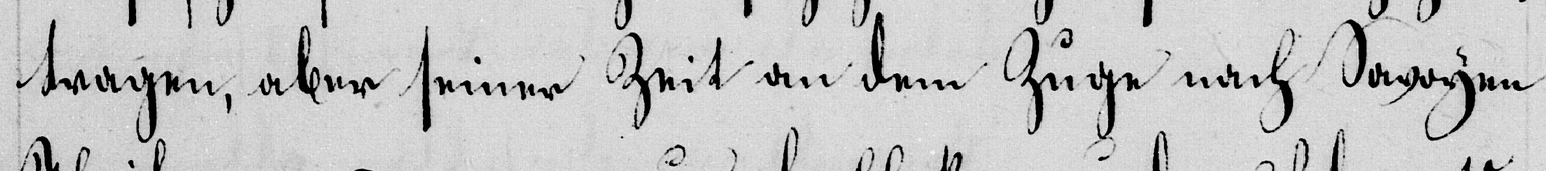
tragen, aber seiner Zeit an dem Zuge nach Savoyen
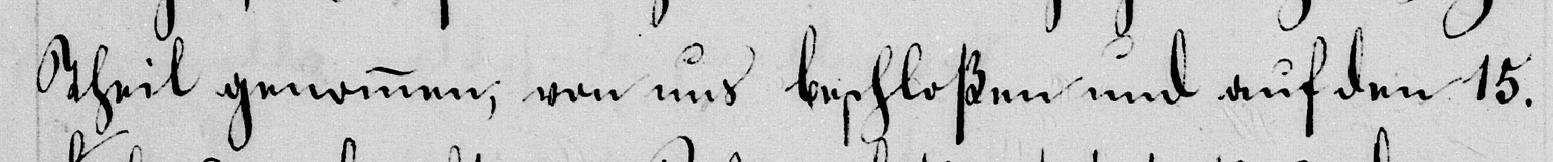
Theil genommen, von uns beschloßen und auf den 15.
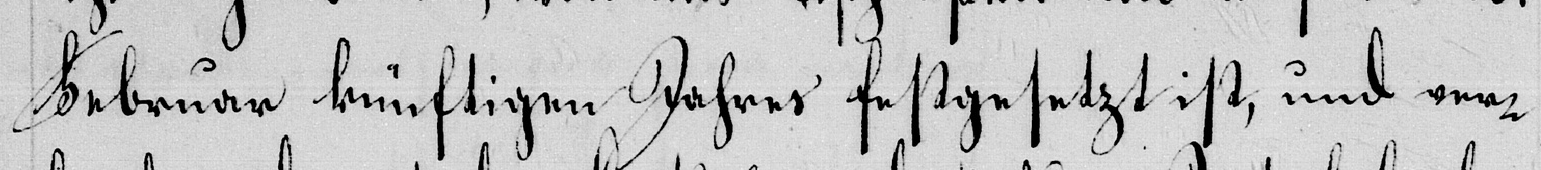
Februar künftigen Jahres festgesetzt ist, und ver¬
